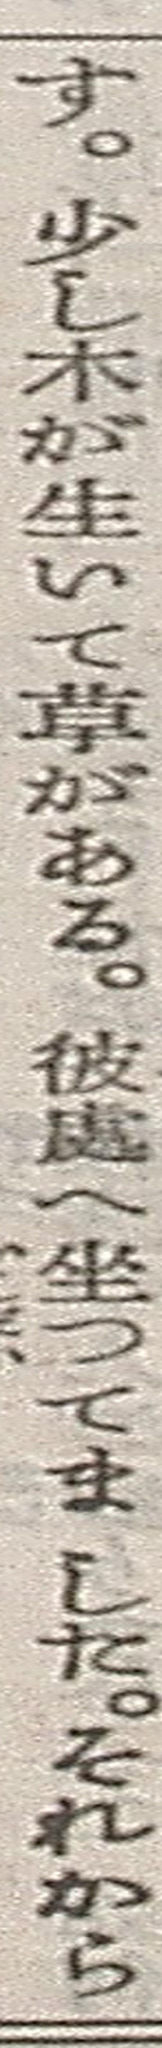す。少し木が生いて草がある。彼処へ坐つてました。それから
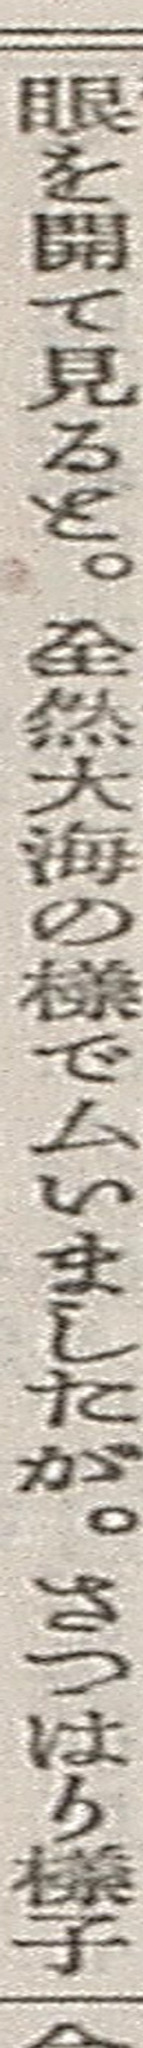眼を開て見ると。全然大海の様でムございましたが。さつはり様子
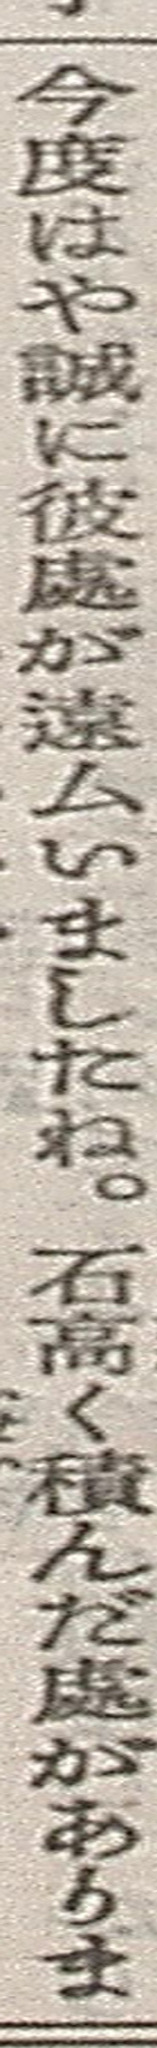今度はや誠に彼処が遠ムいましたね。石高く積んだ処がありま
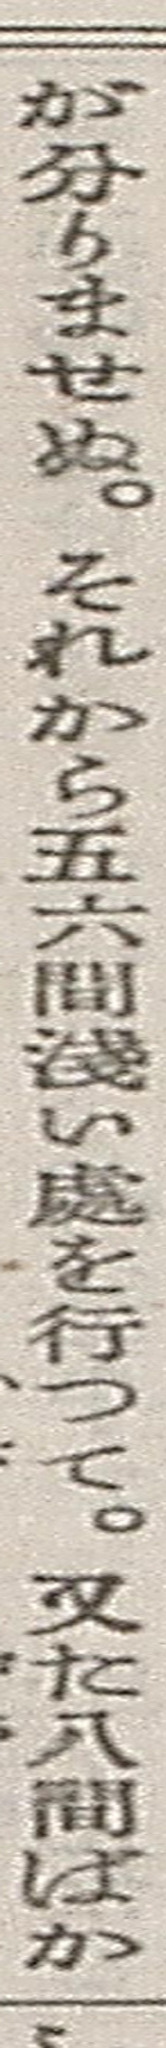が分かりませぬ。それから五六間浅い処を行つて。又た八間ばか
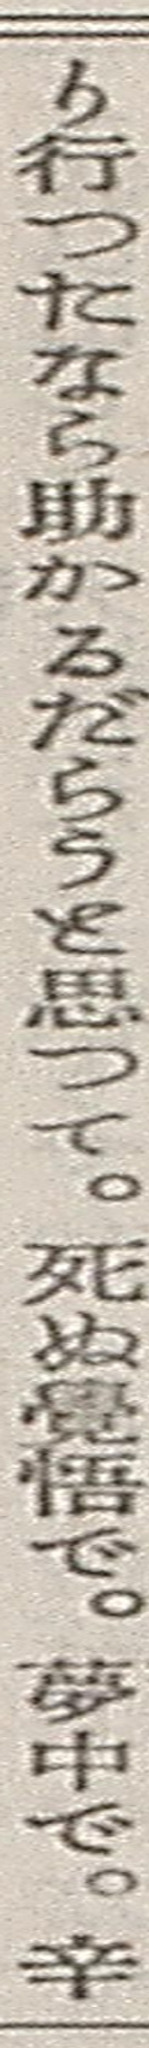り行つたなら助かるだらうと思つて。死ぬ覚悟で。夢中で。辛
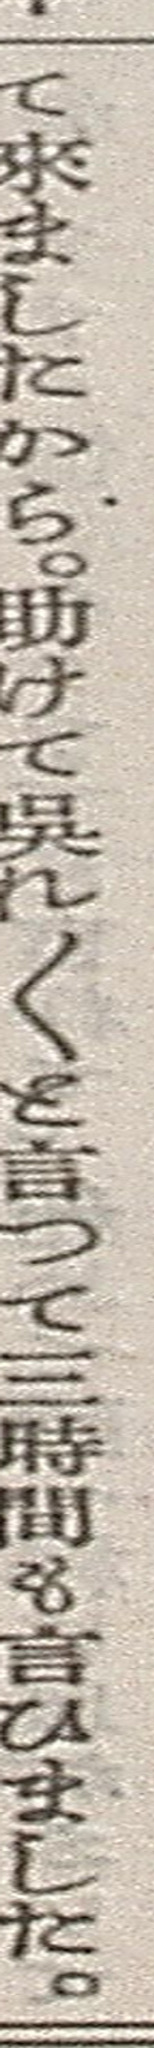て来ましたから。助けて呉れ〳〵と言つて三時間も言ひました。
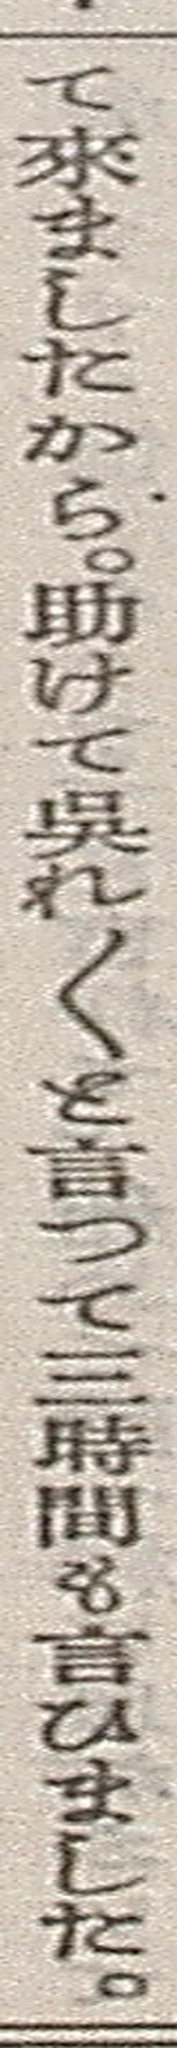て来ましたから。助けて呉れ〳〵と言つて三時間も言ひました。
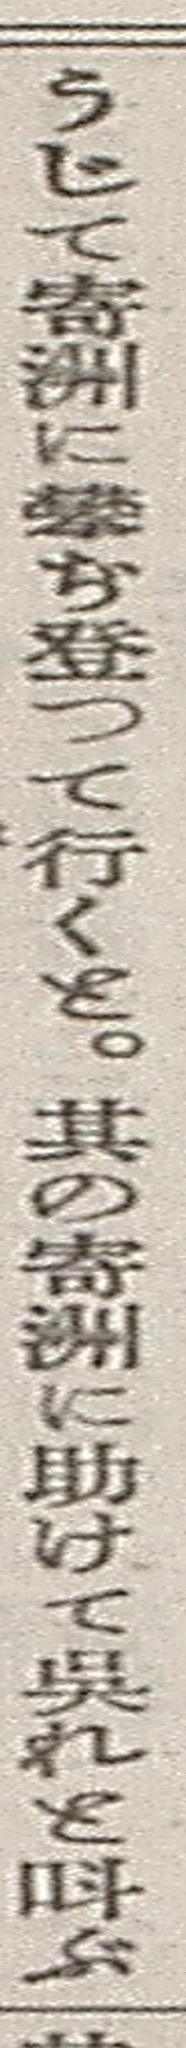うじて寄洲に挙ぢ登つて行くと。其の寄洲に助けて呉れと叫ぶ
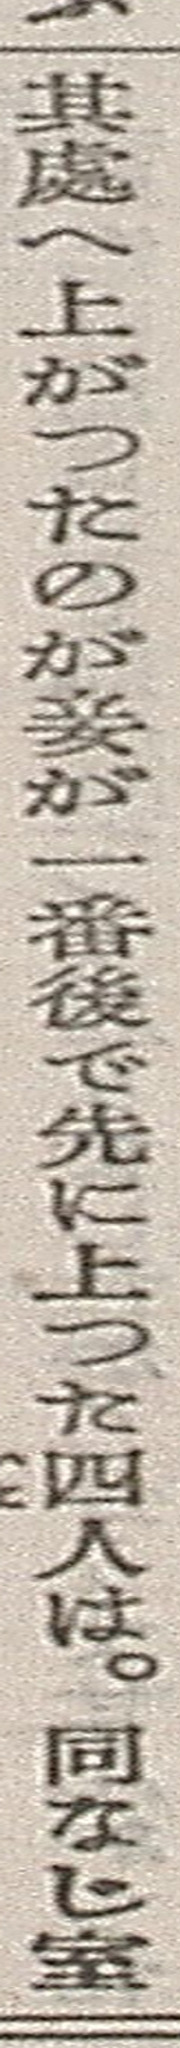其処へ上がつたのが妾が一番後で先に上つた四人は。同なじ室
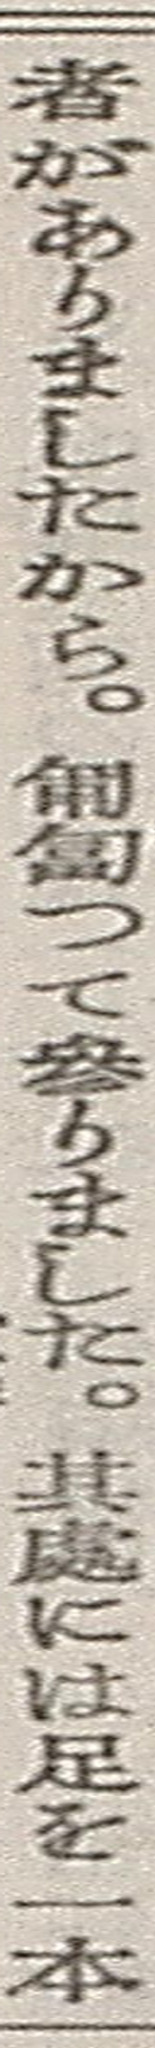者がありましたから。匍匐つて参りました。其処には足を一本
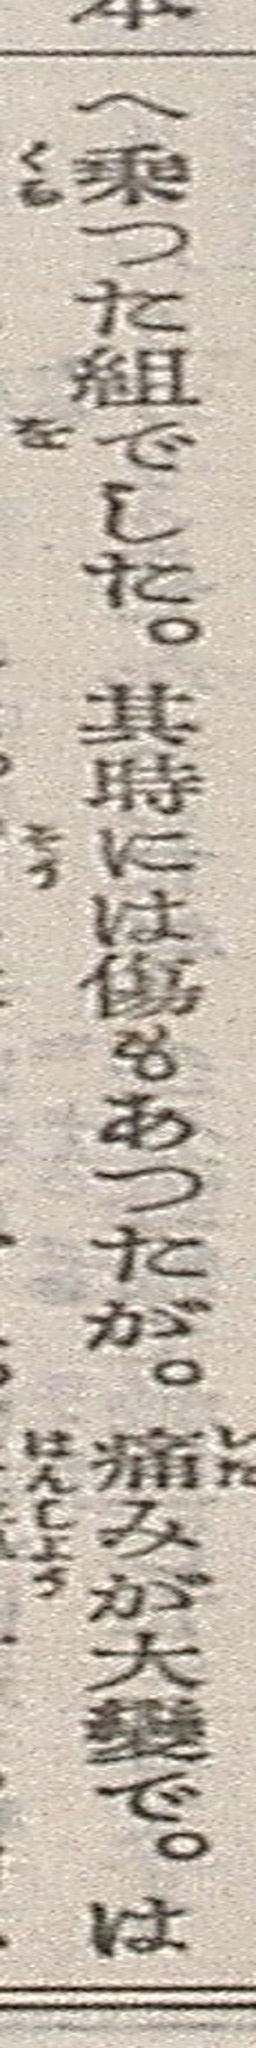へ乗つた組でした。其時には傷もあつたが。痛みが大変で。は
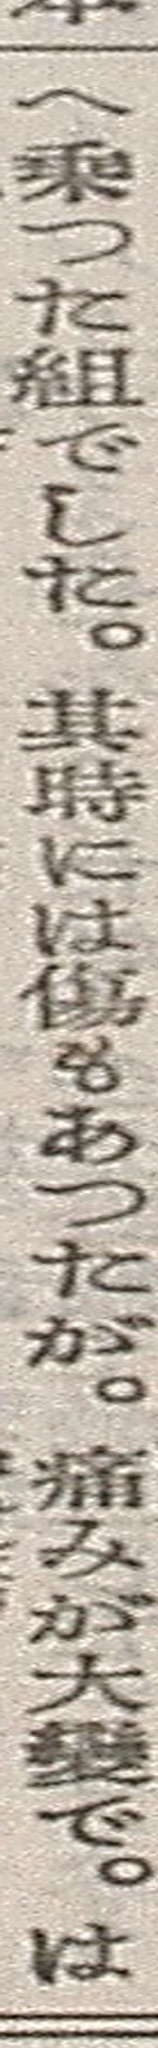へ乗つた組でした。其時には傷もあつたが。痛みが大変で。は
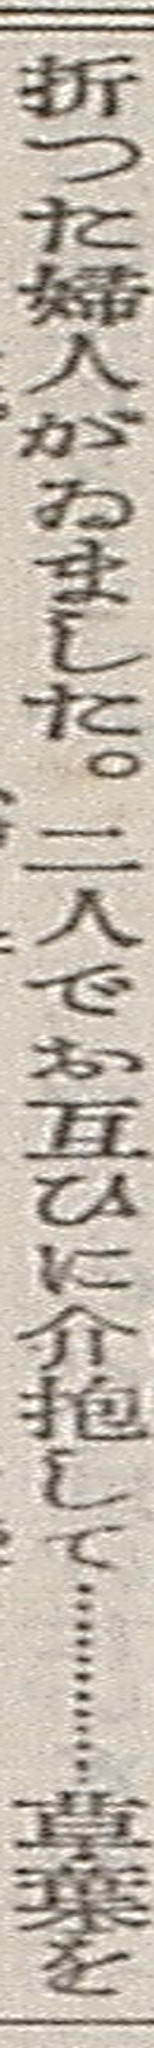折つた婦人がゐました。二人でお互ひに介抱して………草葉を
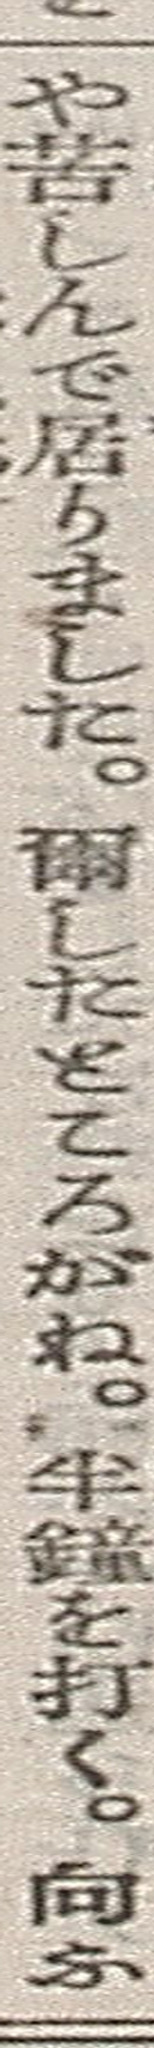や苦しんで居りました。爾したところがね。半鐘を打く。向ふ
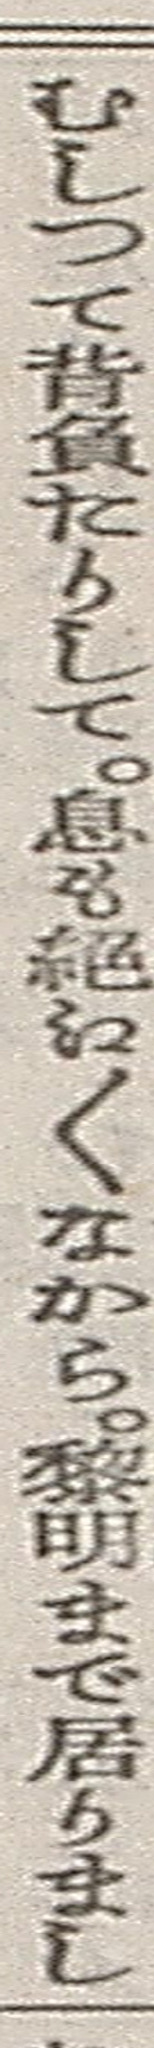むしつて背負たりして。息も絶え〳〵なから。黎明まで居りまし
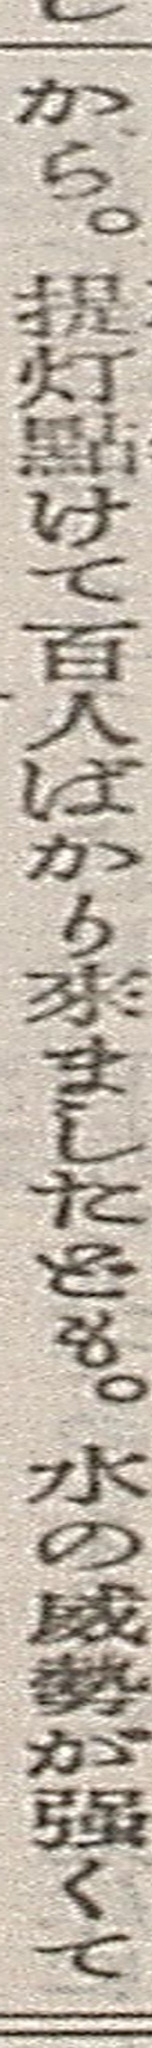から。提灯点けて百人ばかり来ましたども。水の威勢が強くて
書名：風俗畫報臨時増刊第百九十九號　明治三十二年十月各地災害圖會（前編之續）
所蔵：東京大学地震研究所図書室 Earthquake Research Institute Library, The University of Tokyo, JAPAN
